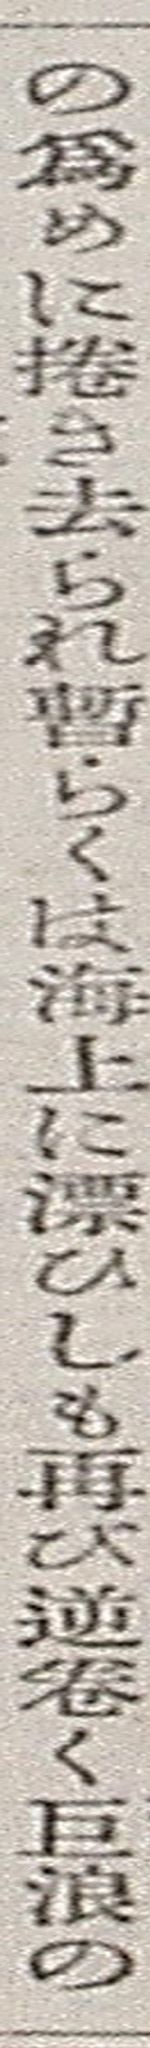の為めに捲き去られ暫らくは海上に漂ひしも再び逆巻く巨浪の
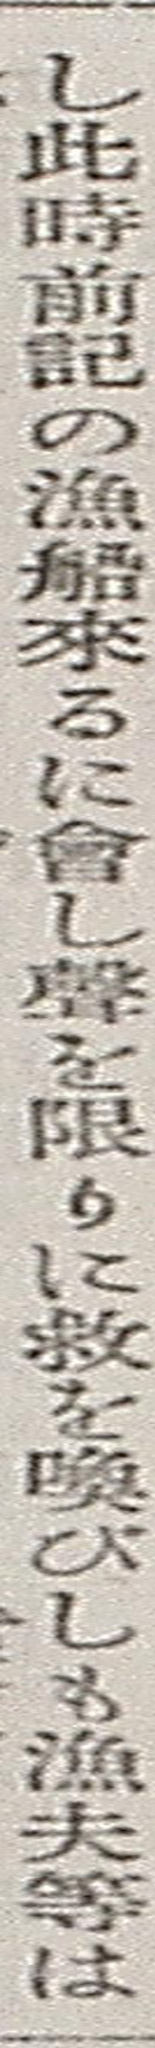し此時前記の漁船来るに会し声を限りに救を喚びしも漁夫等は
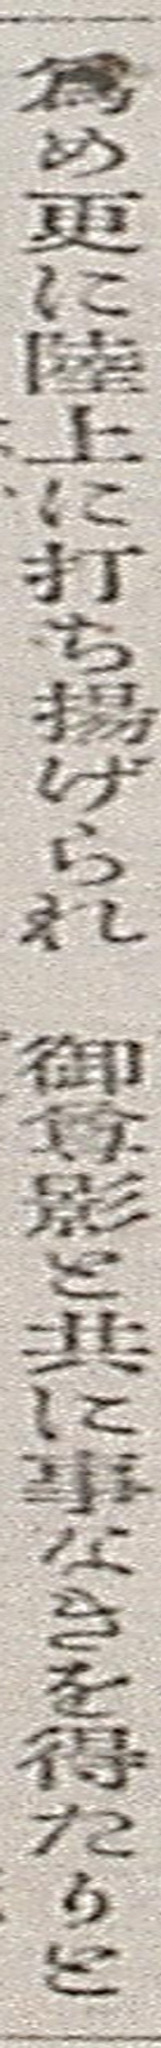為め更に陸上に打ち揚げられ御尊影と共に事なきを得たりと
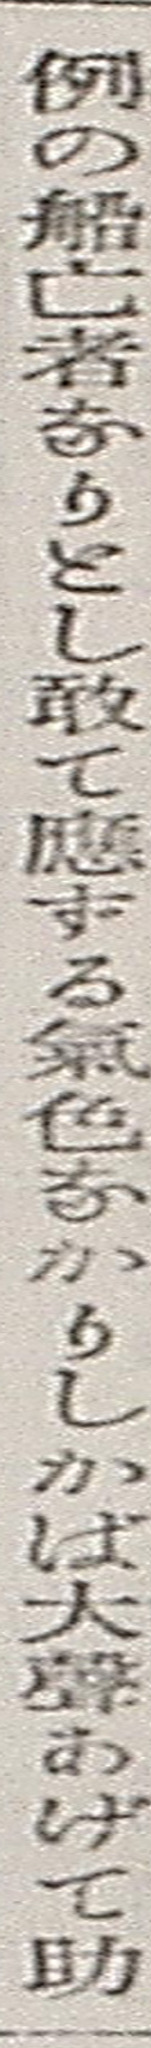例の船亡者なりとし敢て応ずる気色なかりしかば大声あげて助
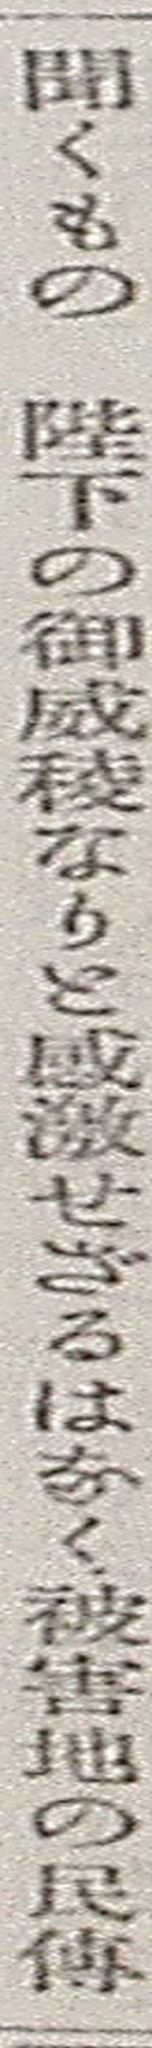聞くもの陛下の御威稜なりと感激せざるはなく被害地の民伝
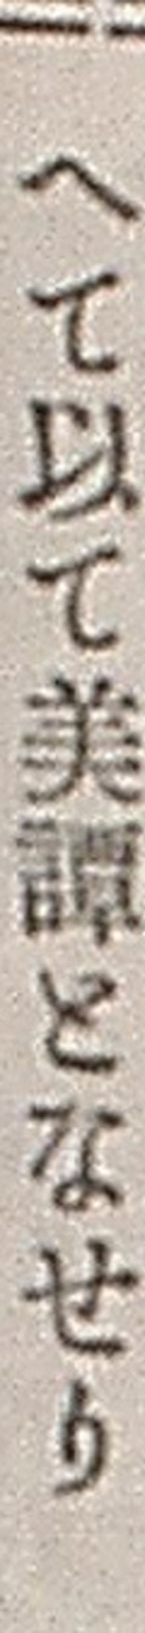へて以て美譚となせり
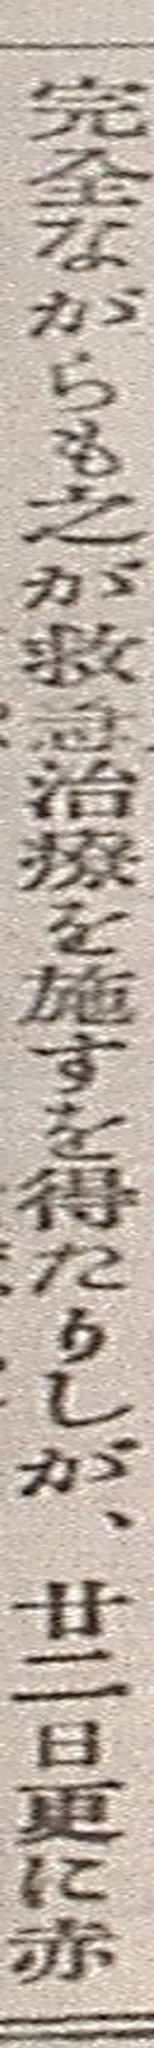完全ながらも之が救急治療を施すを得たりしが、廿二日更に赤
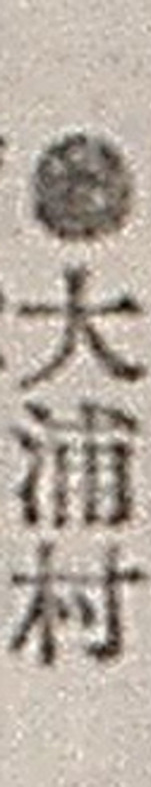●大浦村
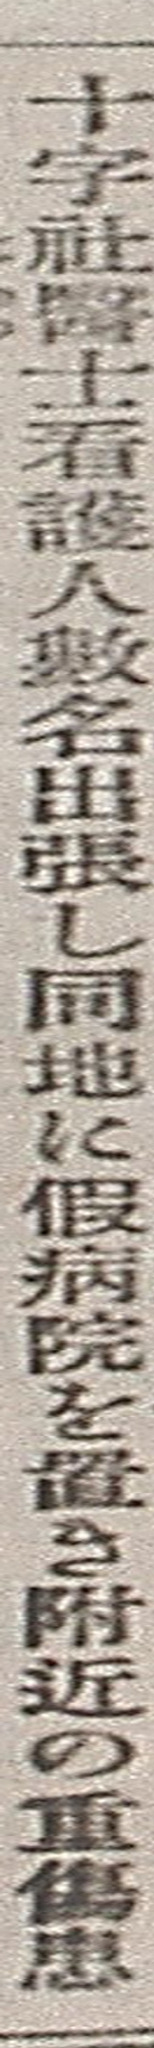十字社医士看護人数名出張し同地に仮病院を置き付近の重傷患
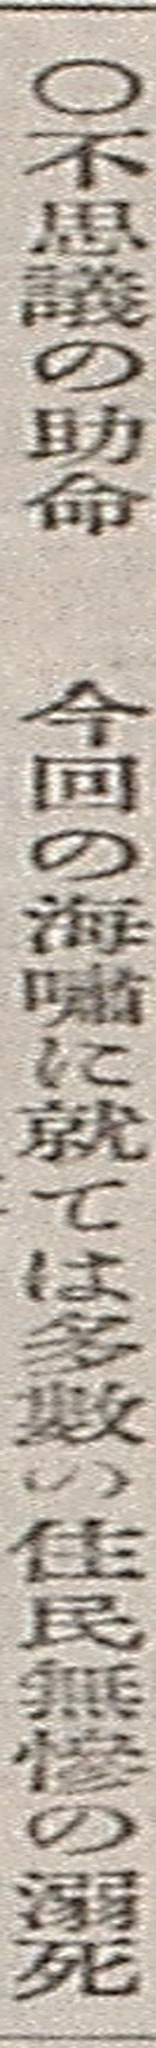○不思議の助命今回の海嘯に就ては多数の住民無惨の溺死
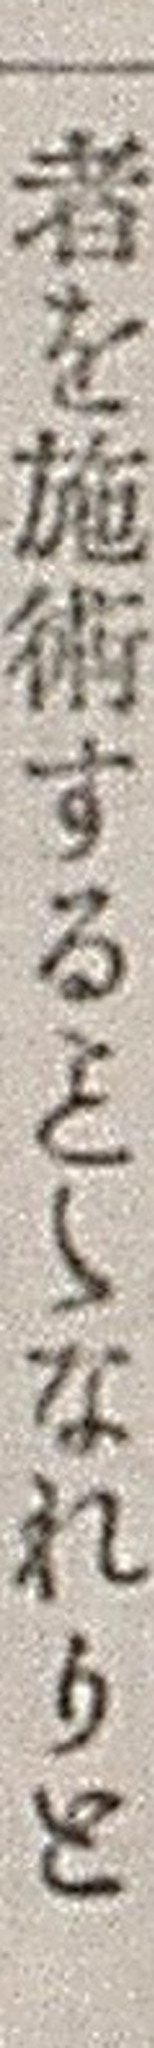者を施術することゝなれりと
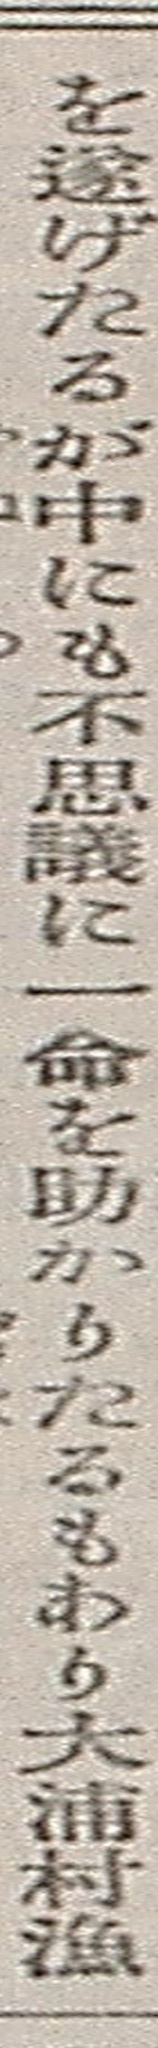を遂げたるが中にも不思議に一命を助かりたるもあり大浦村漁
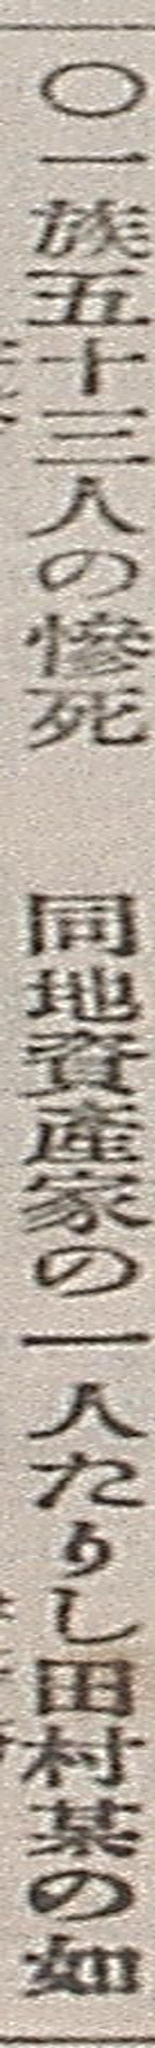○一族五十三人の惨死同地資産家の一人たりし田村某の如
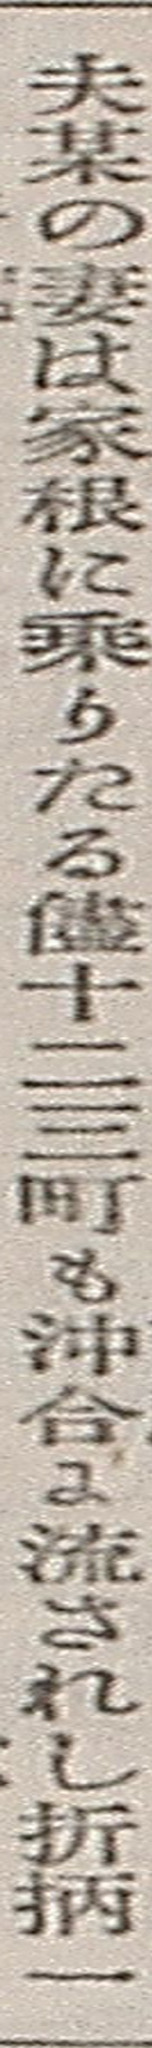夫某の妻は家根に乗りたる侭十二三町も沖合に流されし折柄一
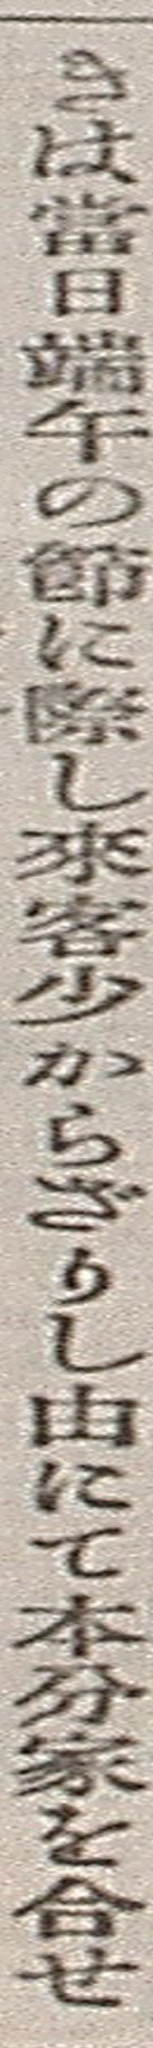きは当日端午の節に際し来客少からざりし由にて本分家を合せ
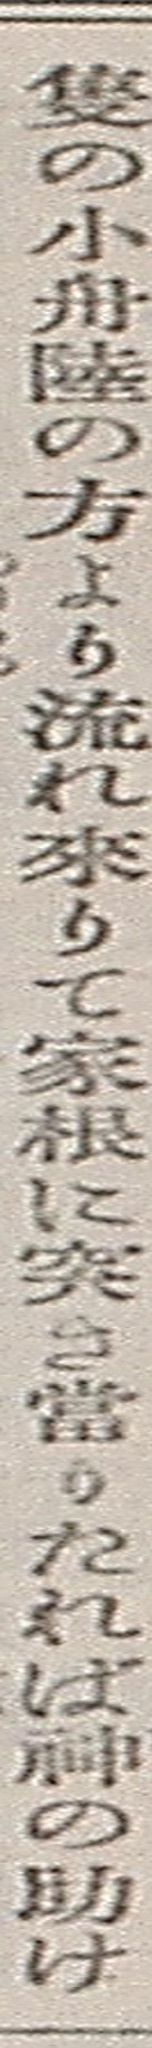隻の小舟陸の方より流れ来りて家根に突き当りたれば神の助け
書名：風俗畫報臨時増刊第百十九號　大海嘯被害録（中）
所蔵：東京大学地震研究所図書室 Earthquake Research Institute Library, The University of Tokyo, JAPAN
